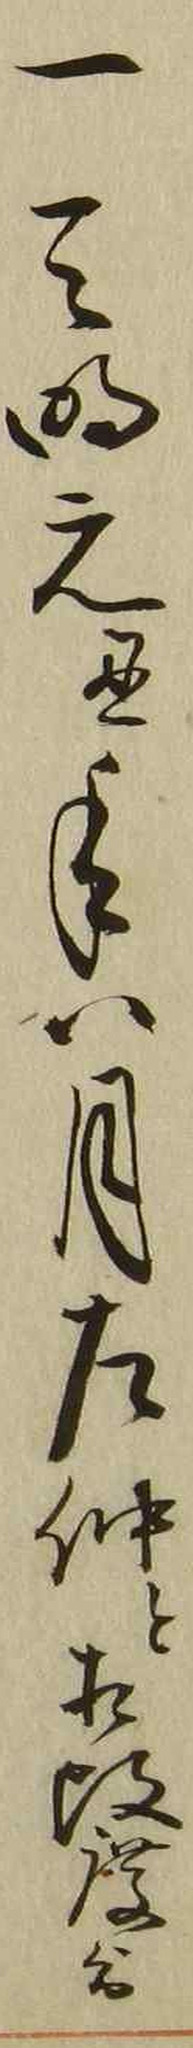一天明元丑年八月左仲と相改度旨
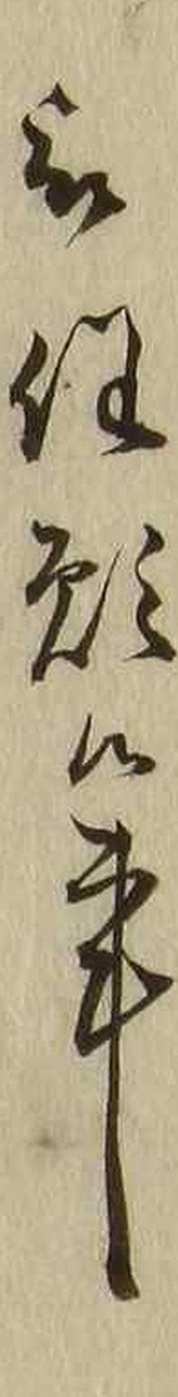被任願候事
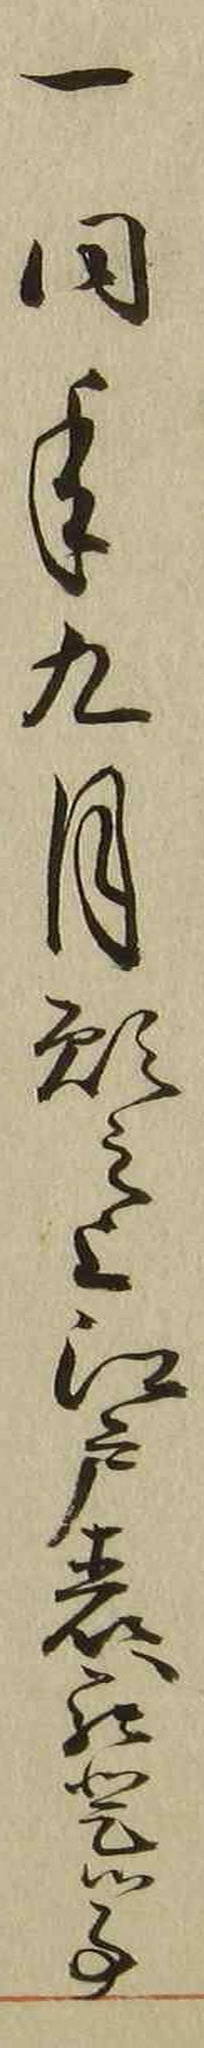一同年九月願之上江戸表へ罷登候事
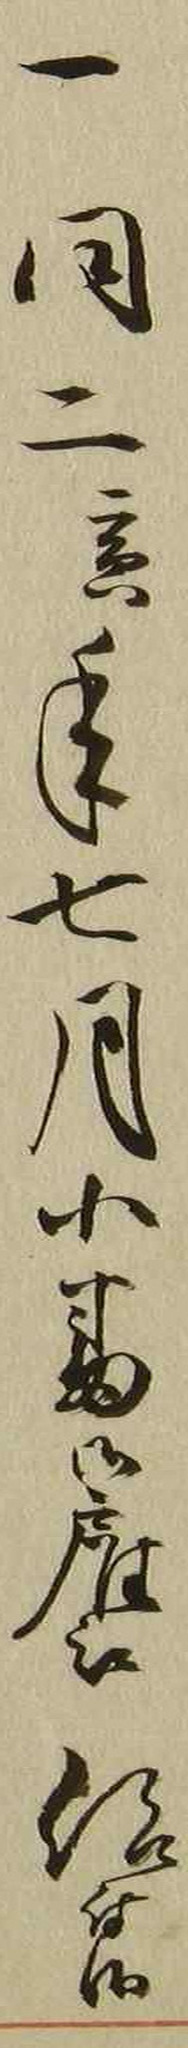一同二寅年七月小番御雇被仰付候
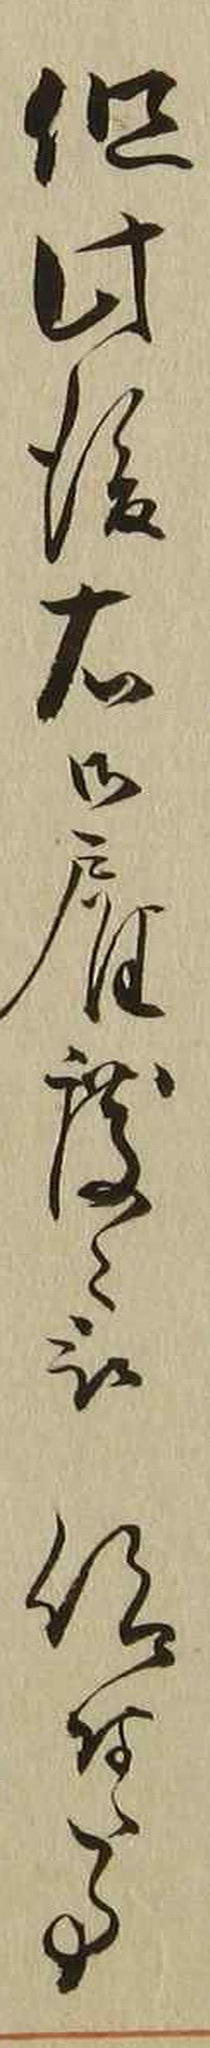但此後右御雇度々被仰付候事
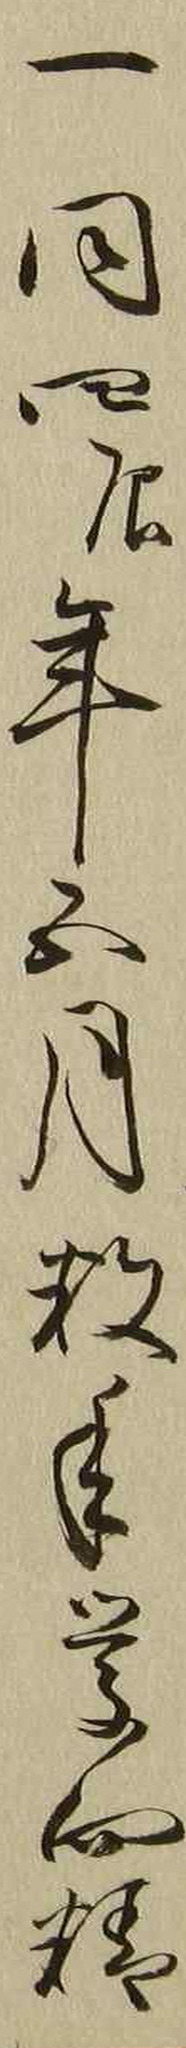一同四辰年五月数年学向精
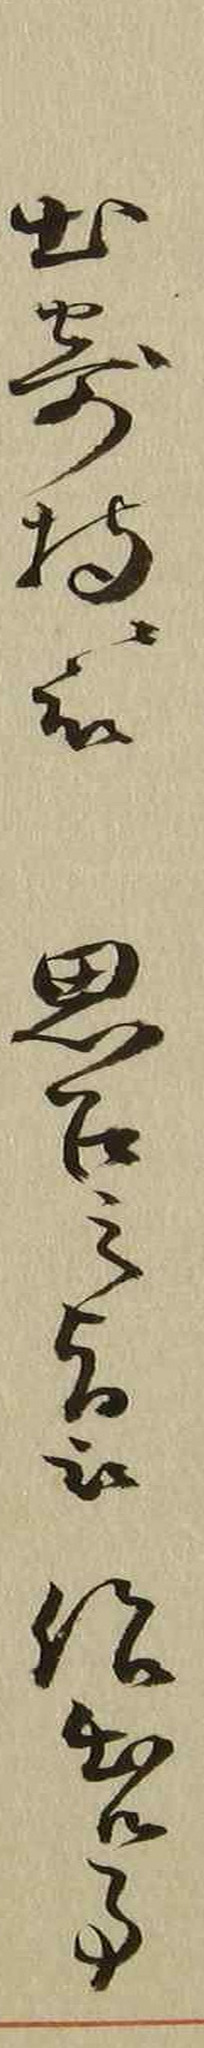出寄持ニ被思召之旨被仰出候事
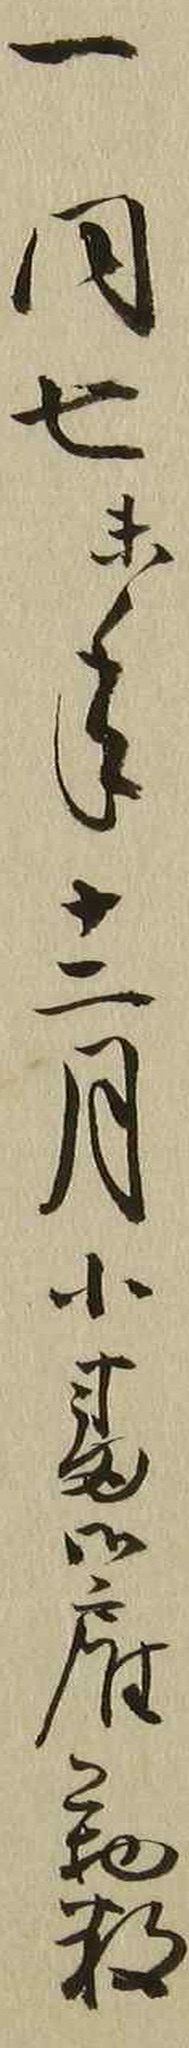一同七未年十二月小番御雇勤数
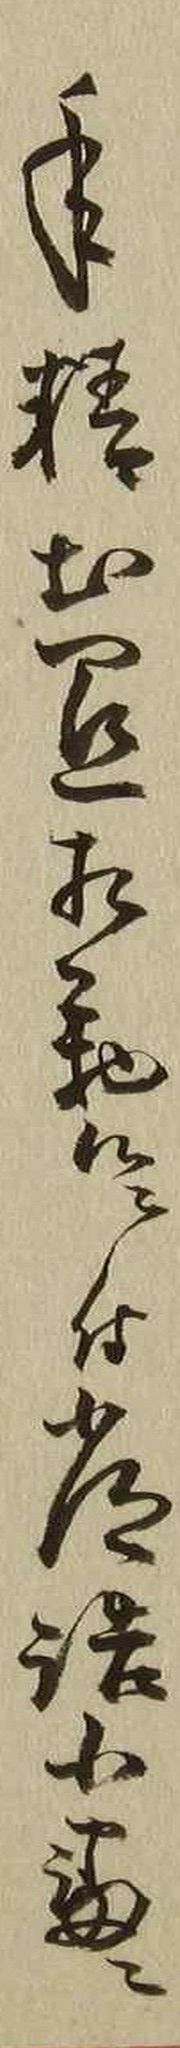年精出宜相勤候ニ付常詰小番ニ
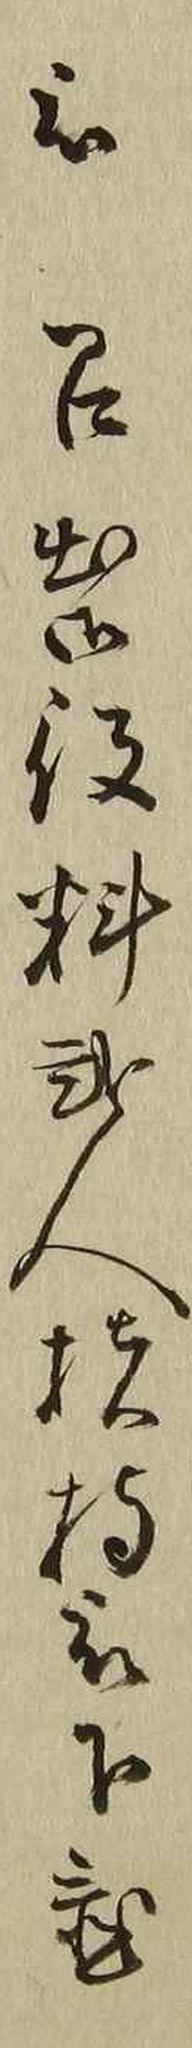被召出御役料弐人扶持被下置
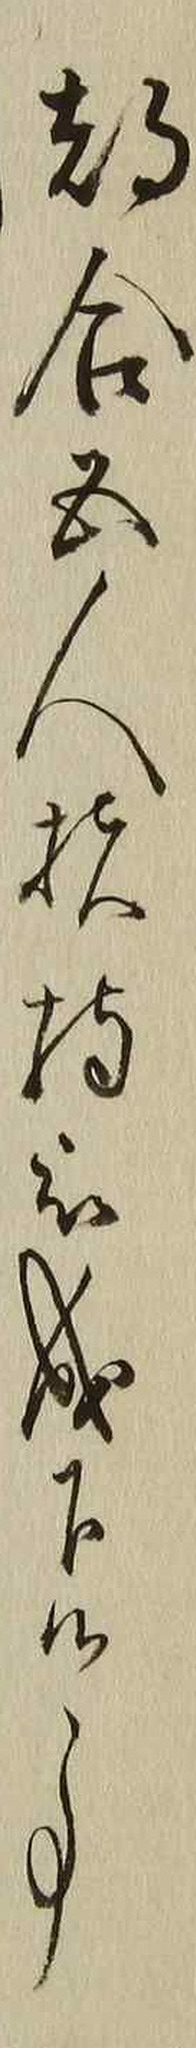都合五人扶持被成下候事
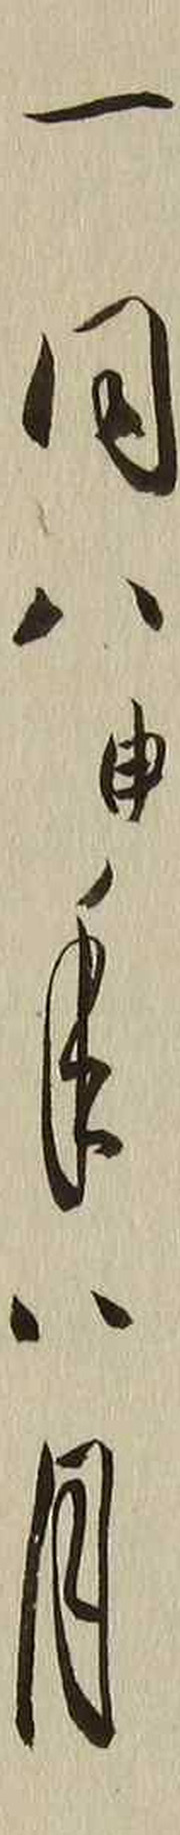一同八申年八月
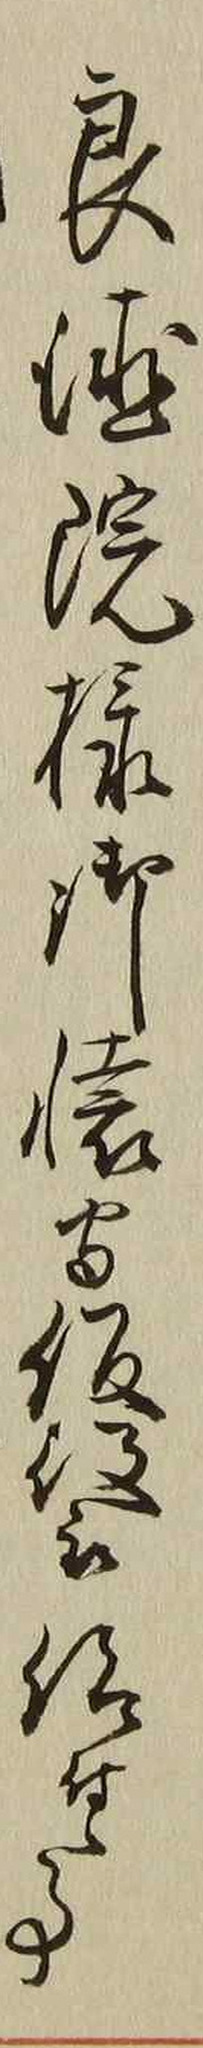良徳院様御懐守仮役被仰付候事
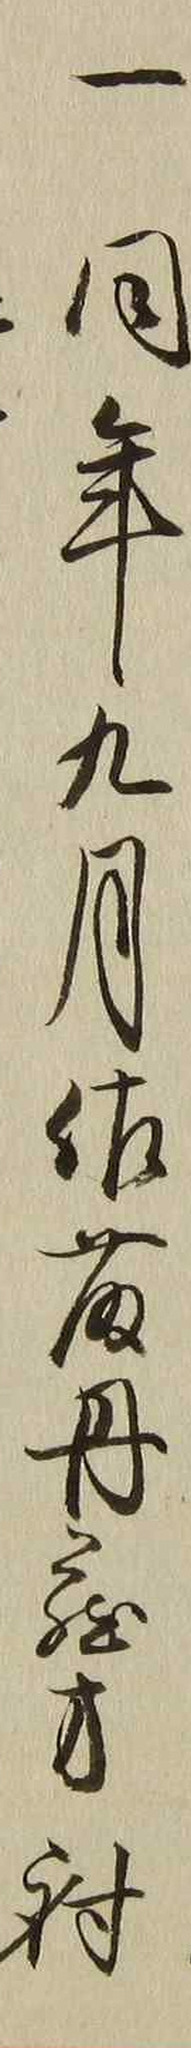一同年九月佐藤丹蔵方射
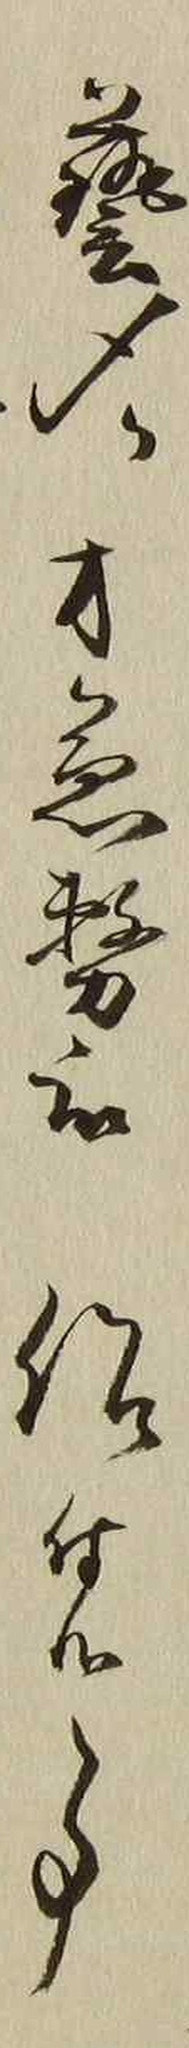芸〆り方兼務被仰付候事
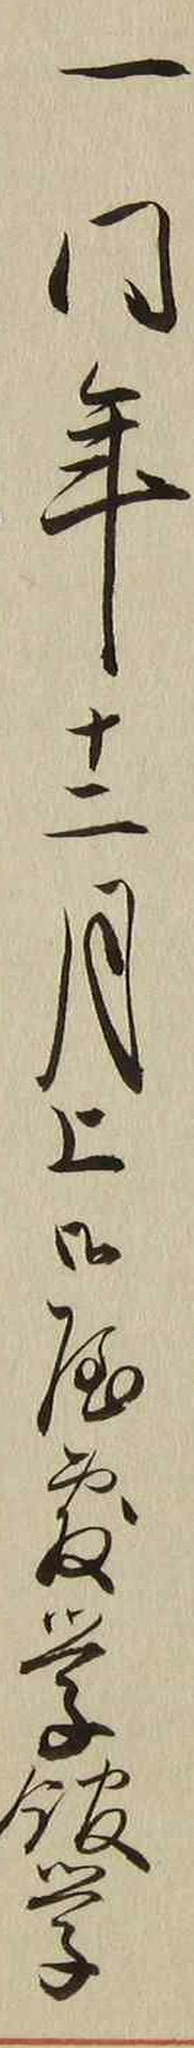一同年十二月上御屋敷学館学
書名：諸士系譜　巻之57　ほ之部4
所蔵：会津若松市立会津図書館
